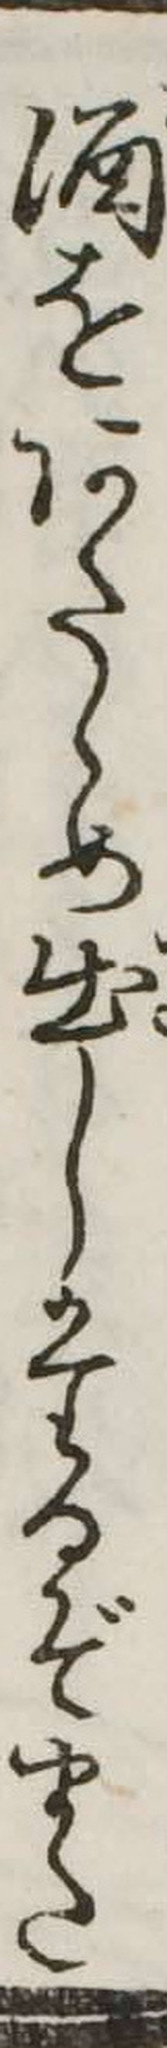酒をあたゝめ出したるぞまた
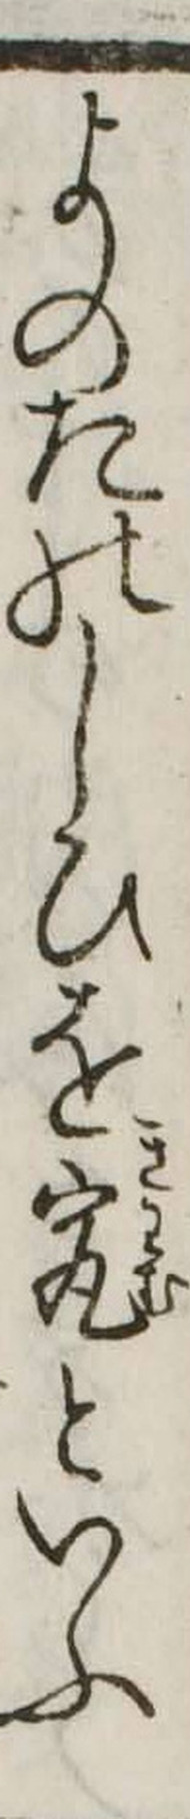よのたのしひを究といふ
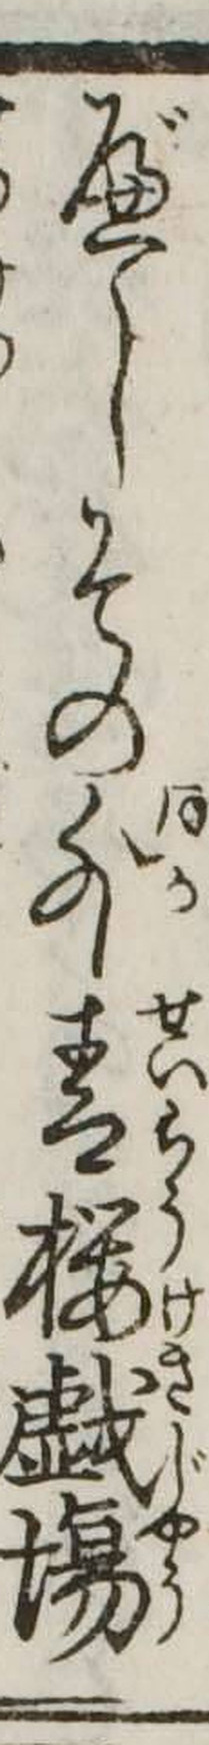べしその外青桜戯場
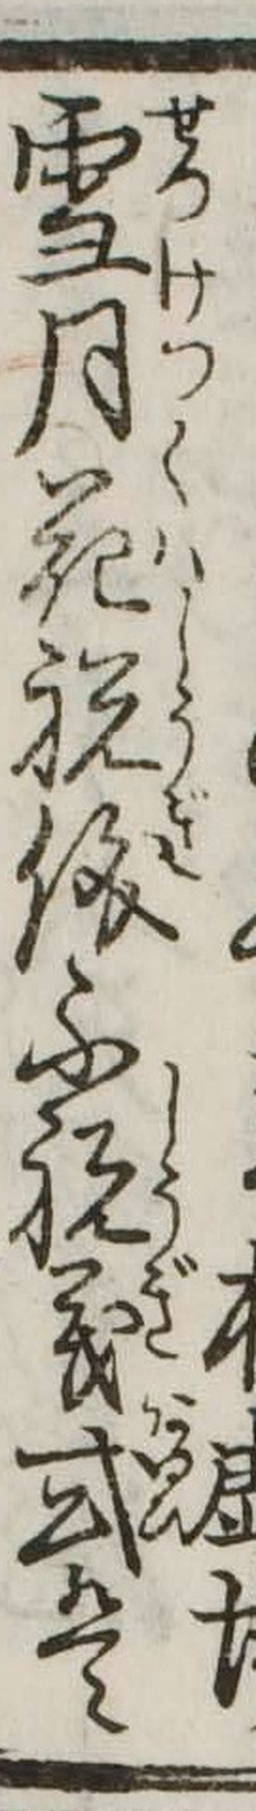雪月花祝儀不祝義或は
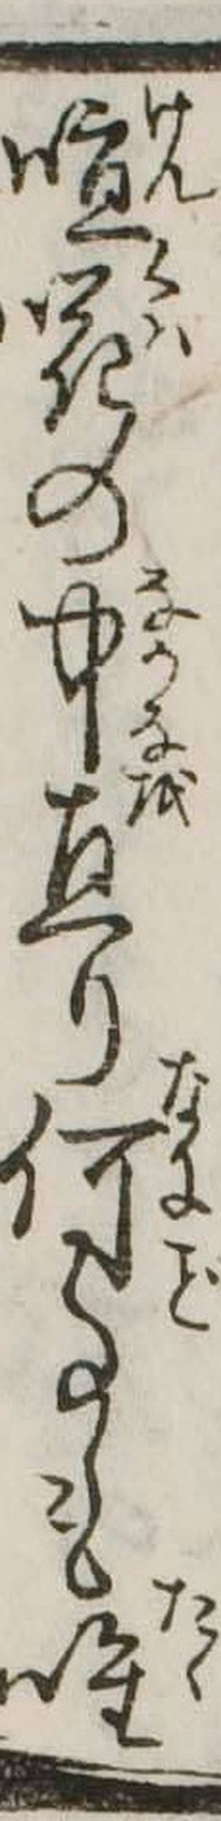喧嘩の中直り何事も唯
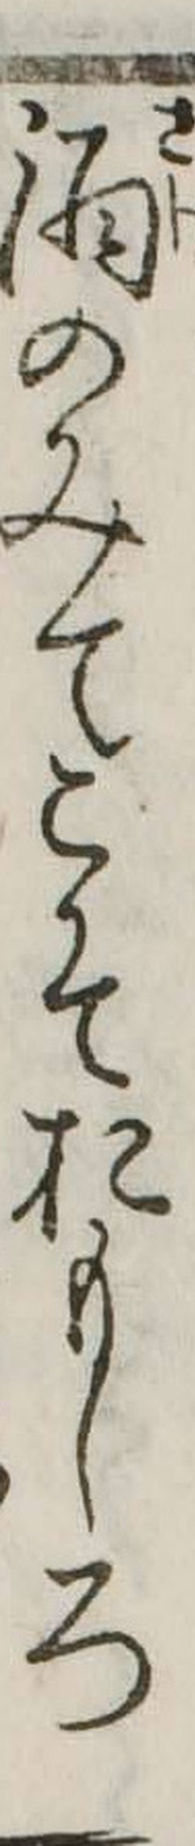酒のみてこそおもしろ
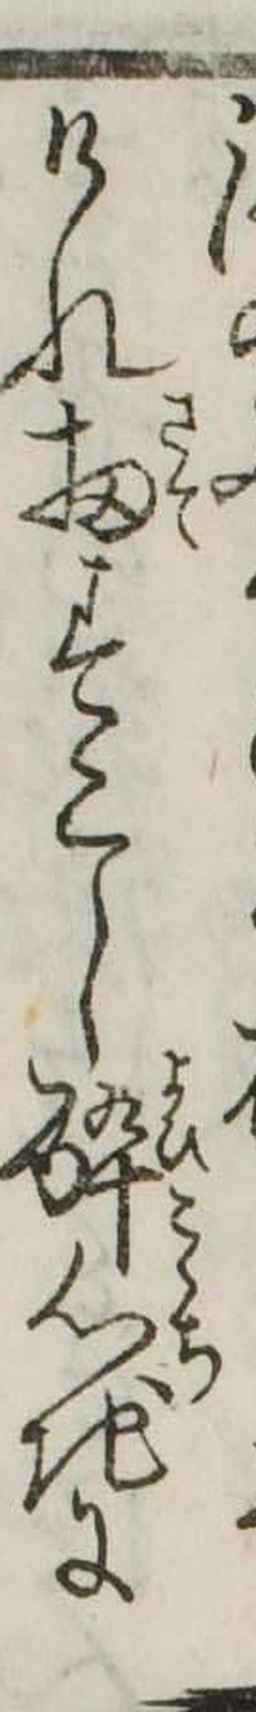けれ扨すこし酔心地に
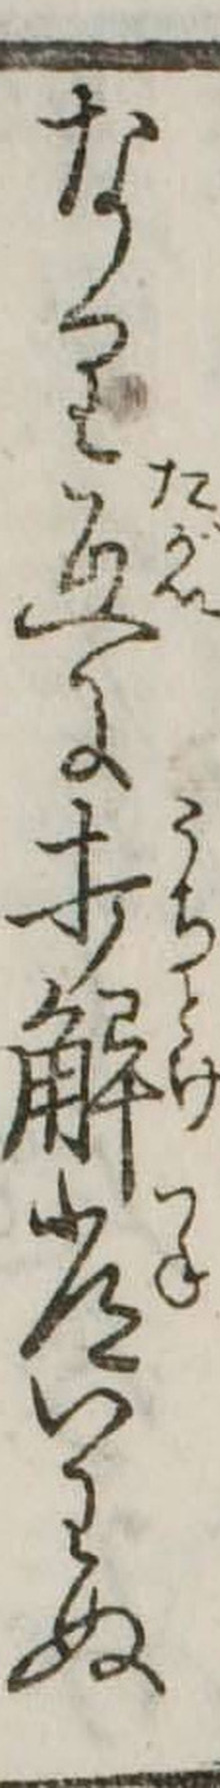なり互に打解常いわぬ
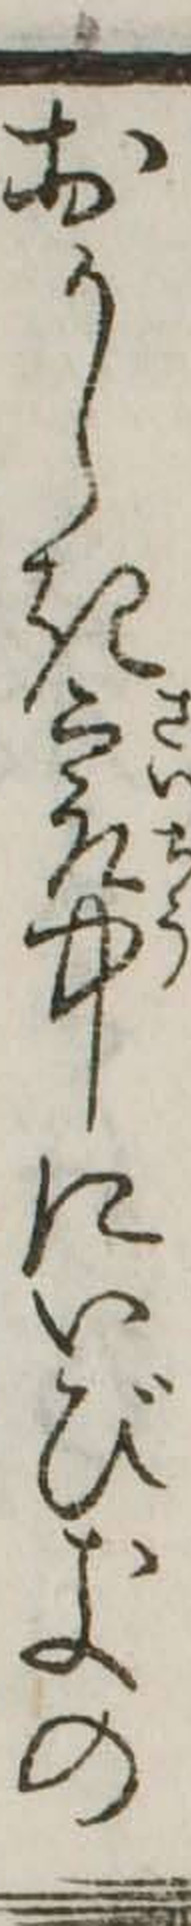おかしき最中にいびきの
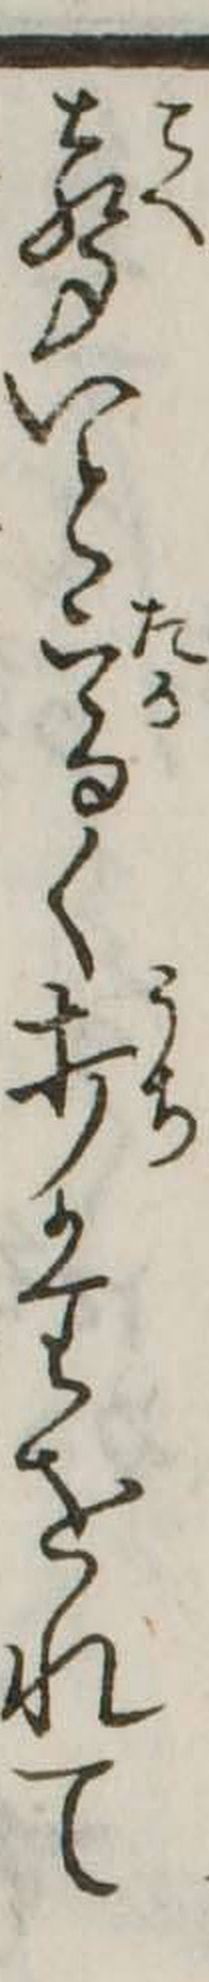声いと高く打たをれて
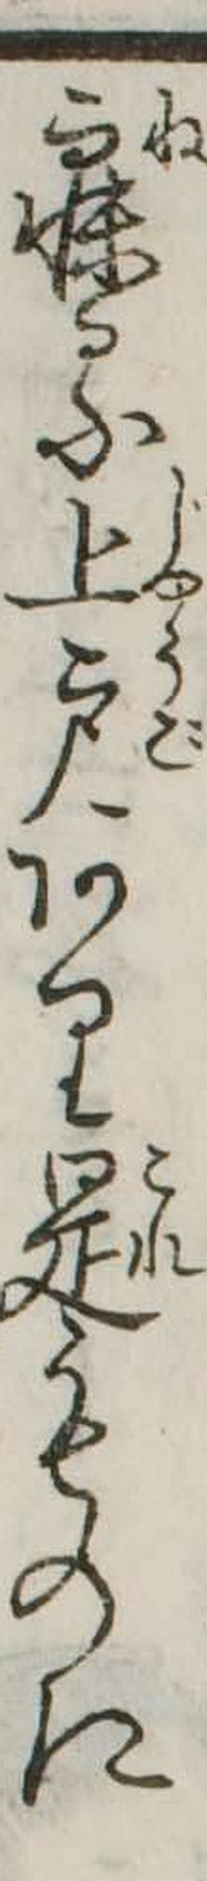寝る上戸あり是ものに
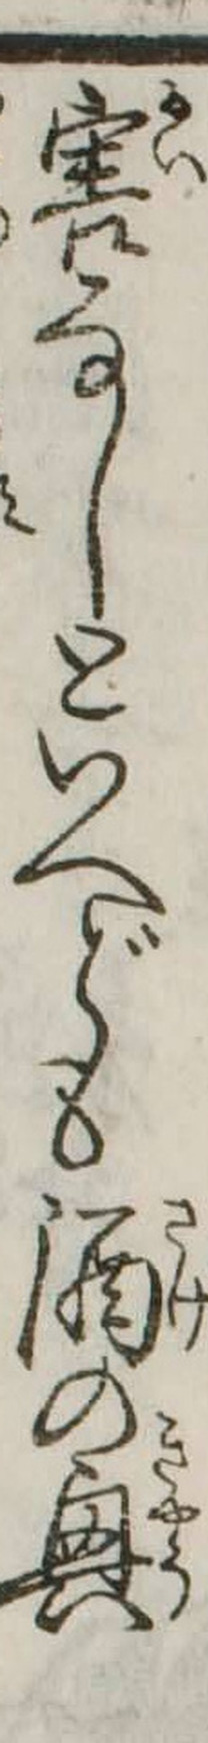害なしといへども酒の興
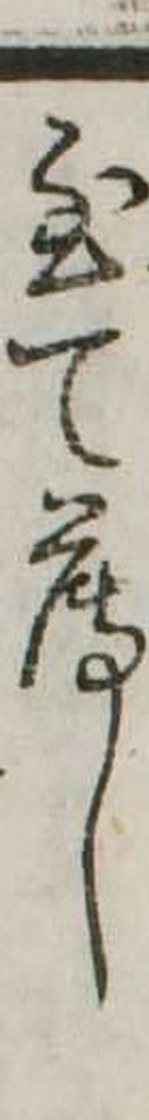至て薄し
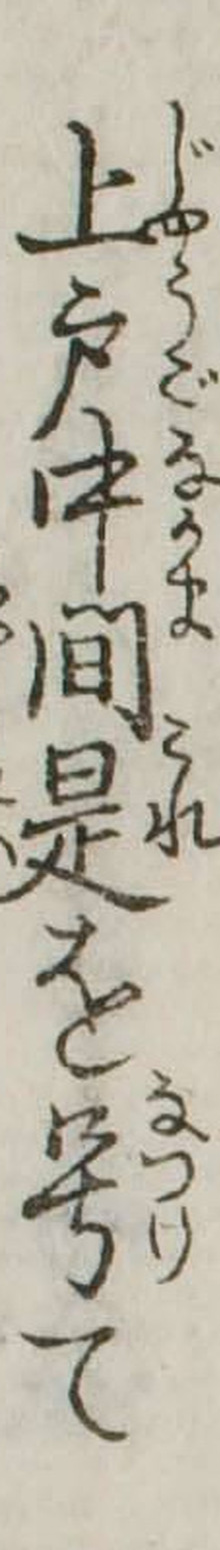上戸中間是を号て
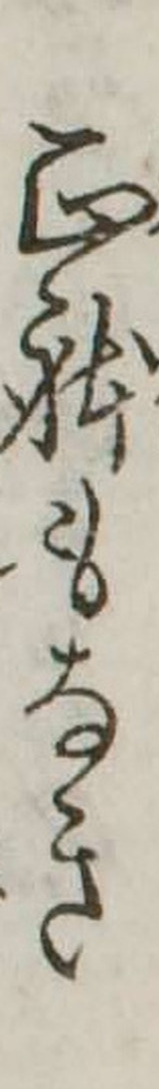正躰もなき
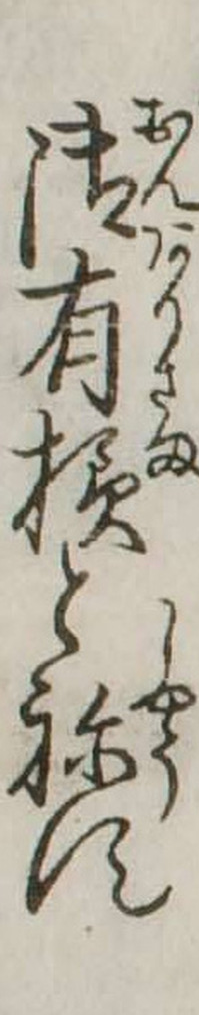御有様と称す
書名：繪本不盡泉
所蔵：国文学研究資料館
